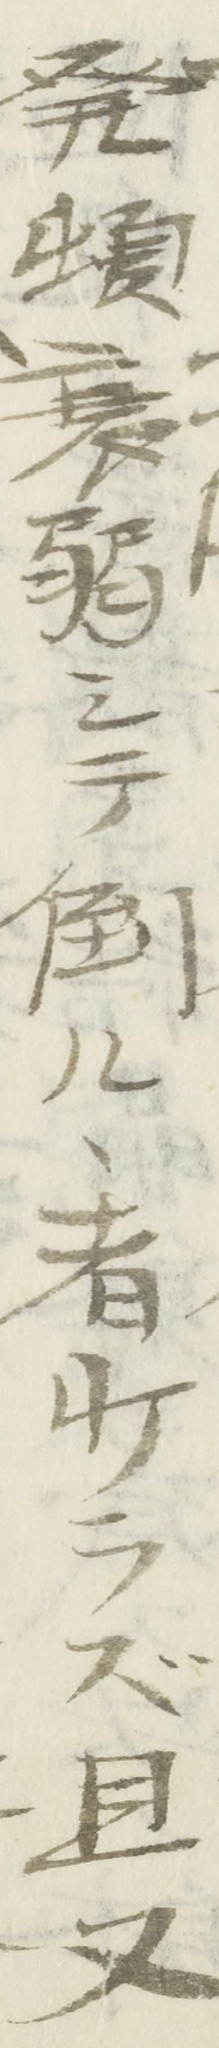初頓衰弱シテ倒ルヽ者少ラズ且又
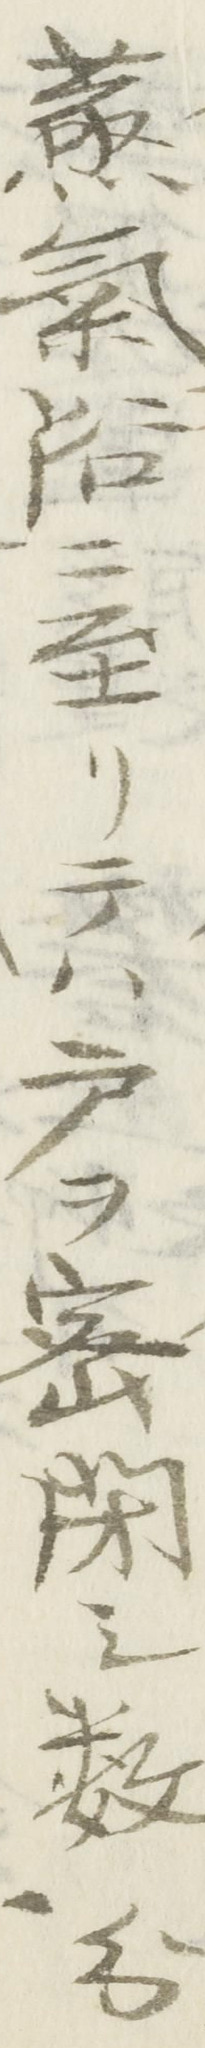蒸気浴ニ至リテハ戸ヲ密閉シ数分
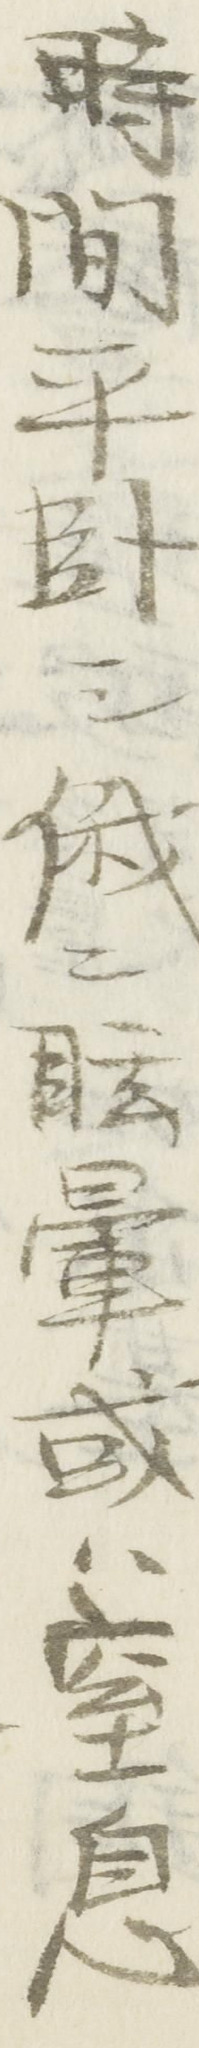時間平臥シ俄ニ眩暈或ハ窒息
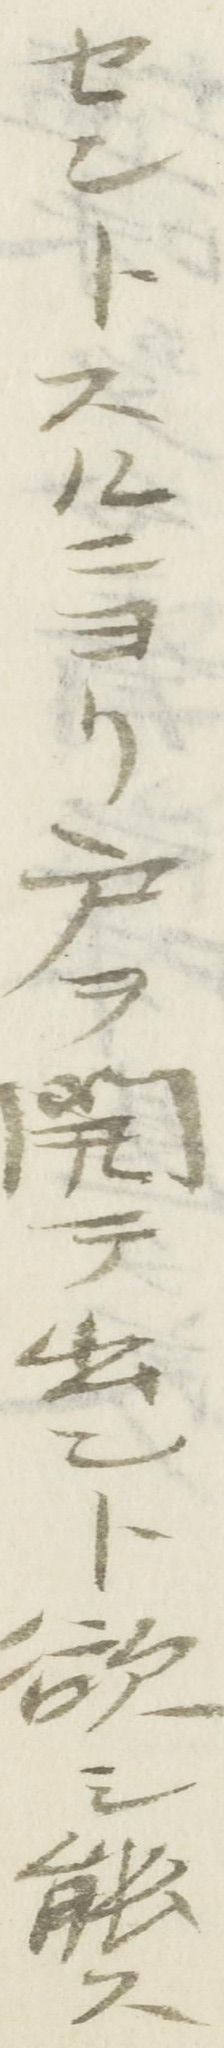セントスルニヨリ戸ヲ開テ出ント欲シ能ス
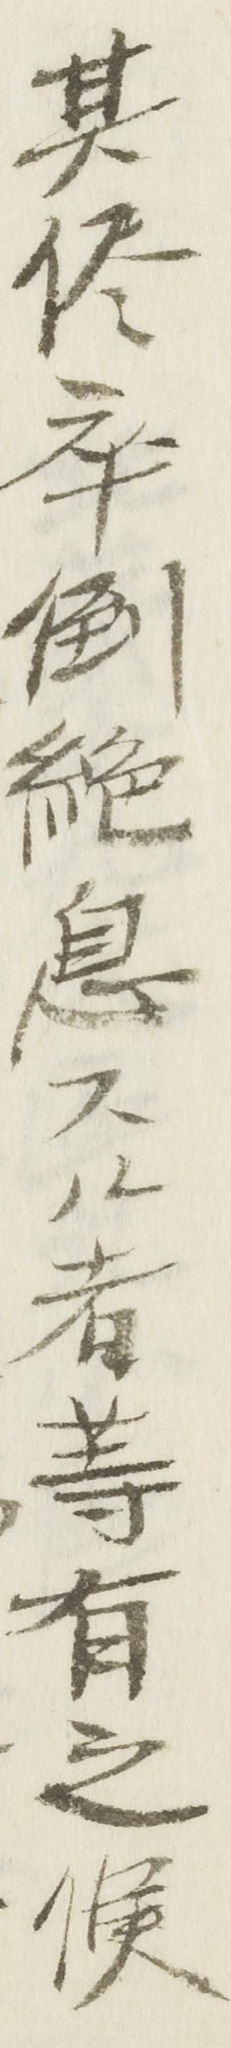其侭卒倒絶息スル者等有之候
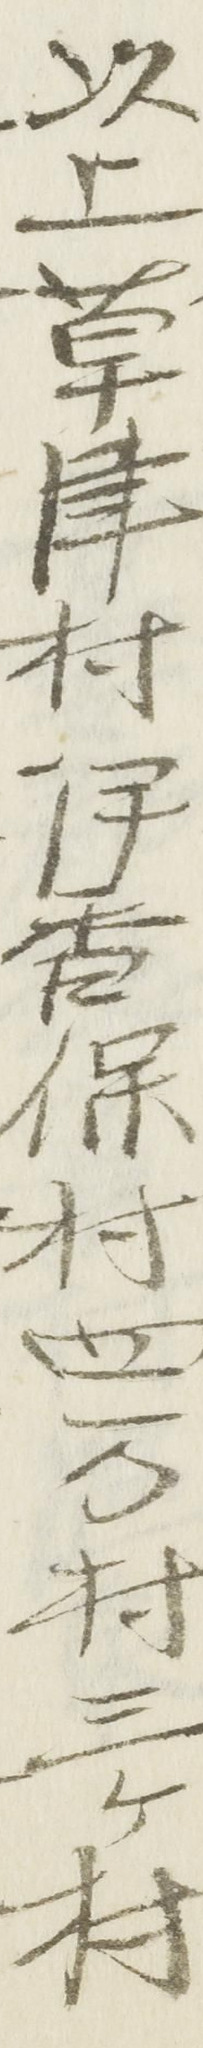以上草津村伊香保村四万村三ケ村
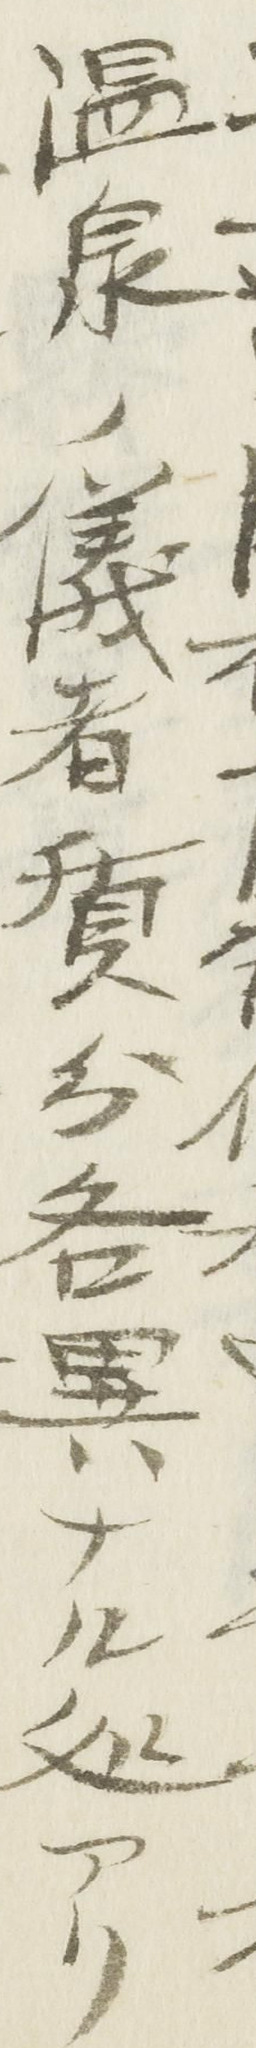温泉ノ儀者質分各異ナル処アリ
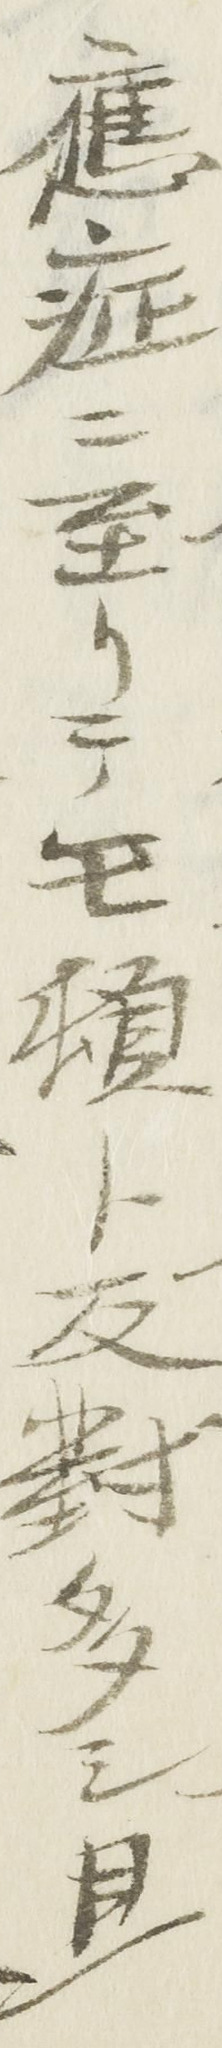応症ニ至りテ其頓ト反対多シ且
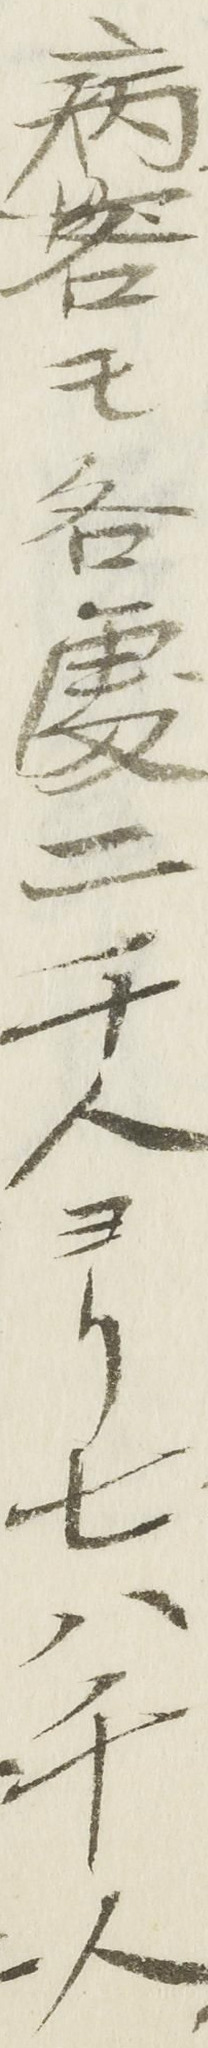病容モ各処ニ千人ヨリ七八千人
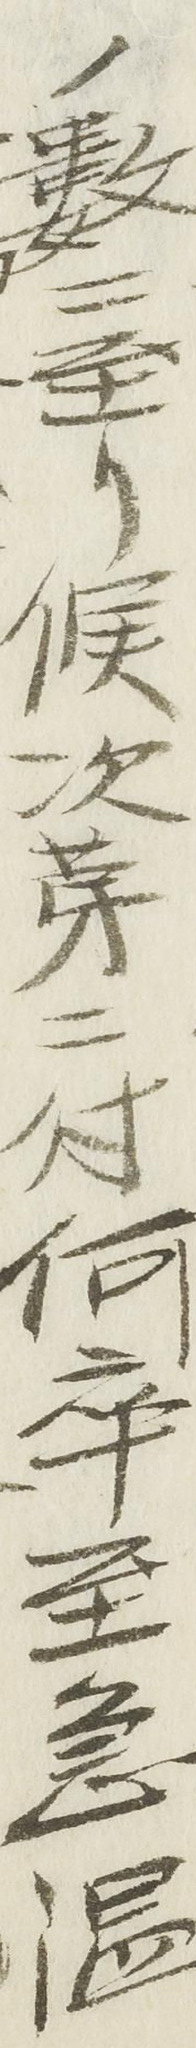ノ数ニ至り候次第ニ付何卒至急温
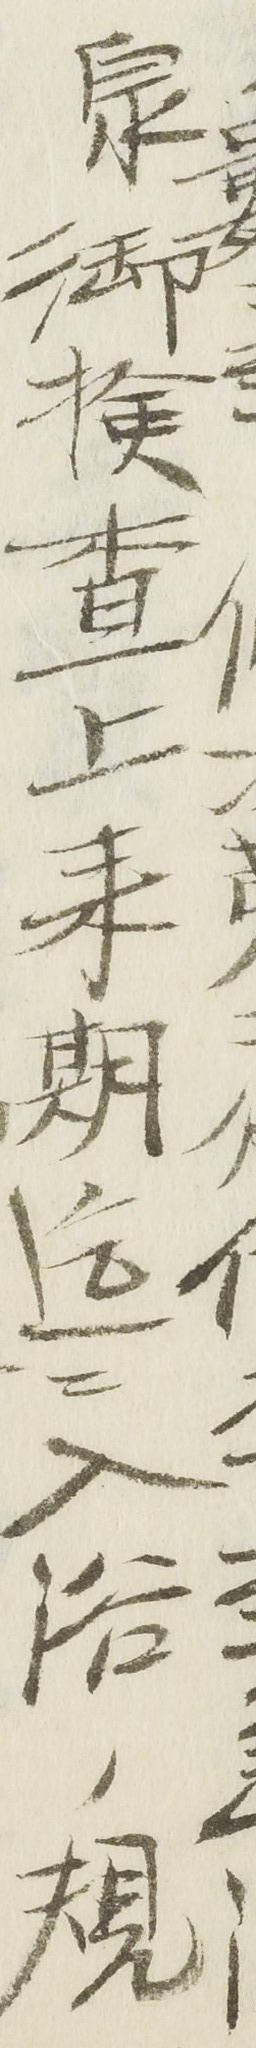泉御検査上来期迄ニ入浴ノ規
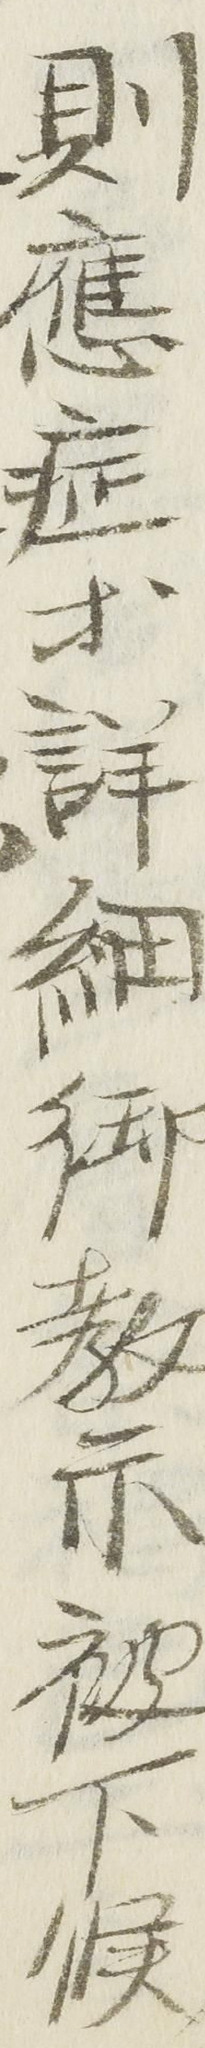則応症等詳細御教示被下候
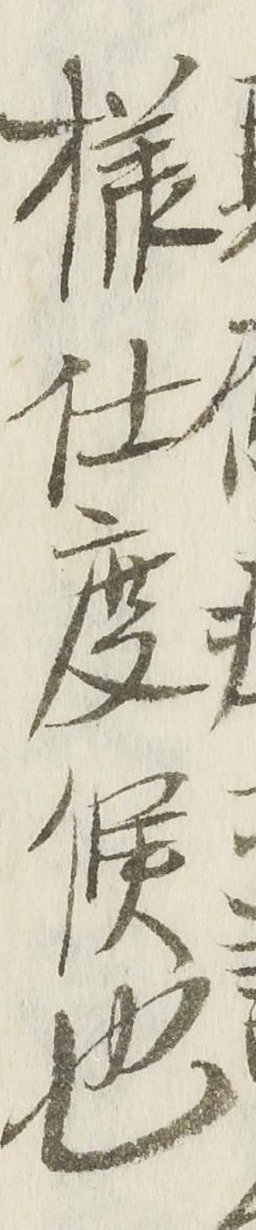様支度候也

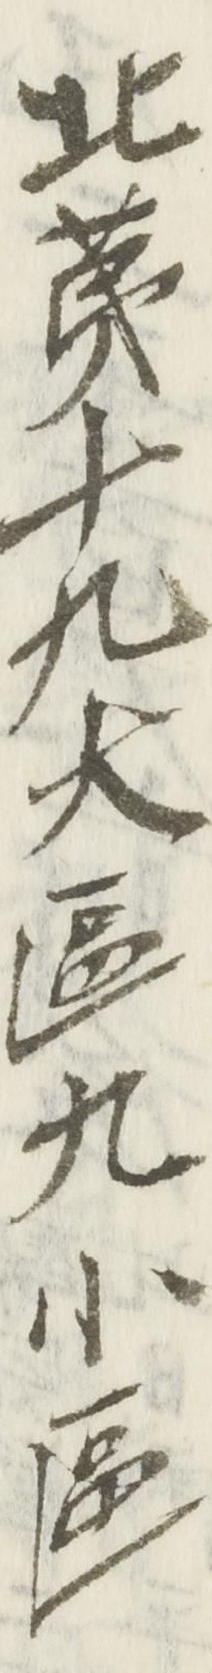北緯十九大區九小區
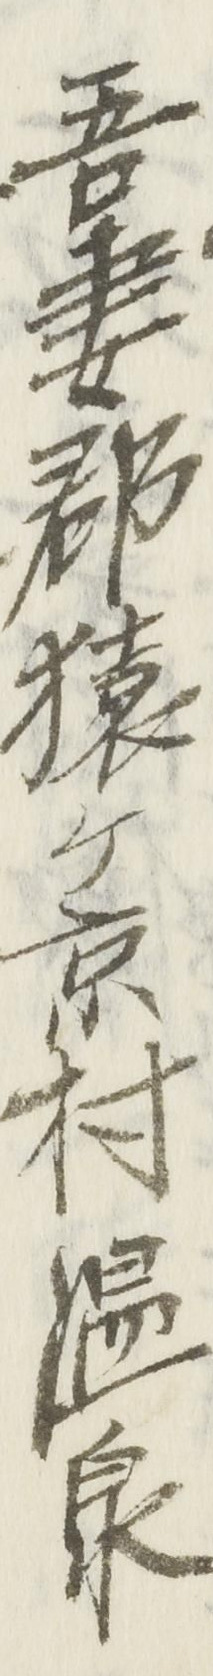吾妻郡猿ケ京村温泉
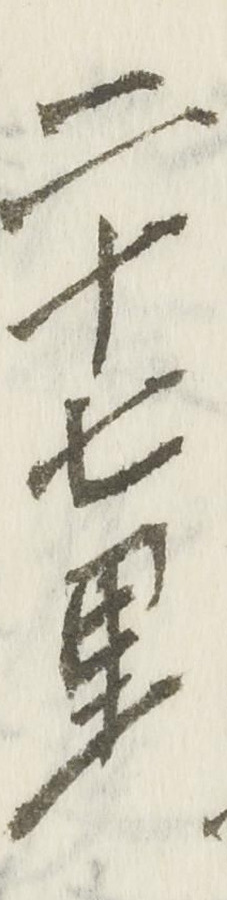二十七里
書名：温冷泉試験表
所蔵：東京大学地震研究所図書室 Earthquake Research Institute Library, The University of Tokyo, JAPAN
